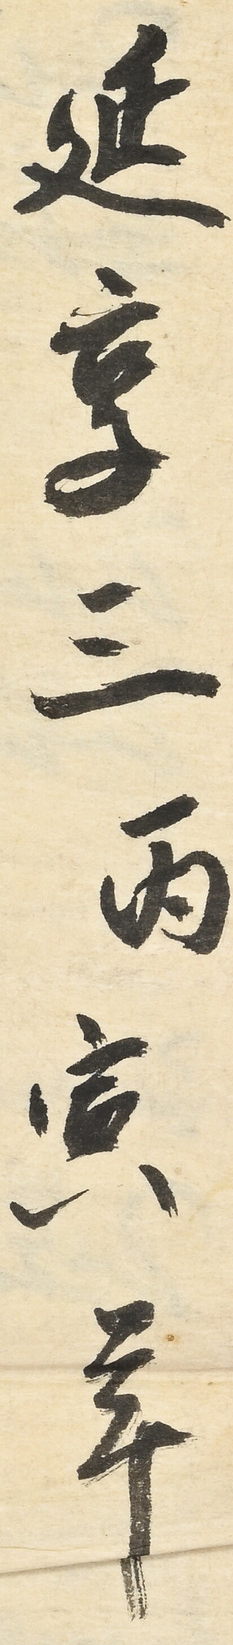延享三丙年
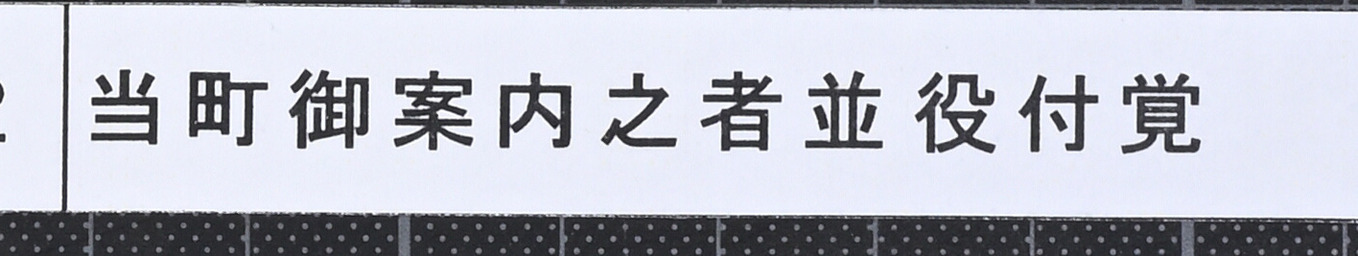当町御案内之者并役付覚
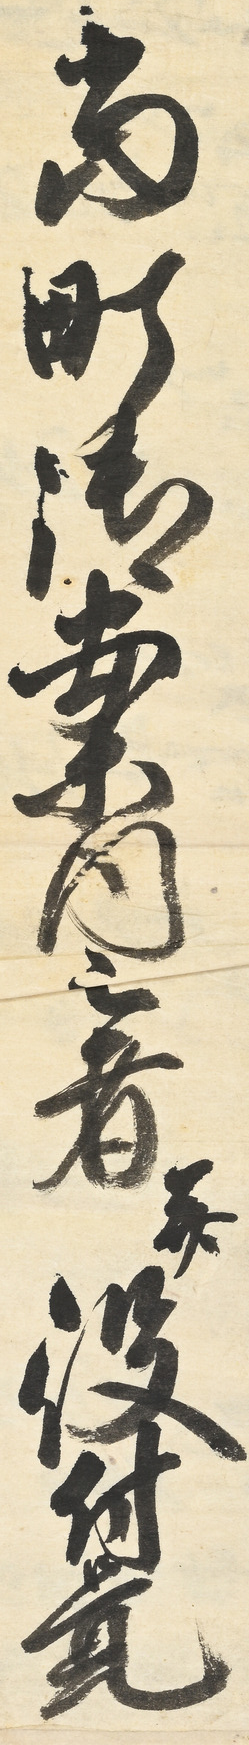当町御案内之者并役付覚
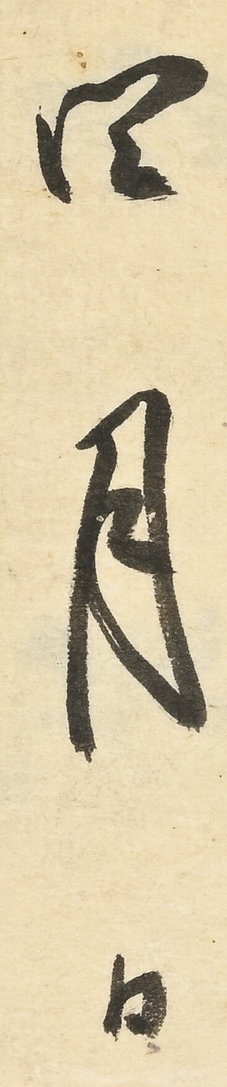四月日
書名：当町御案内之者並に役付覚
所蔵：伊那市立高遠町図書館・合同会社AMANE
